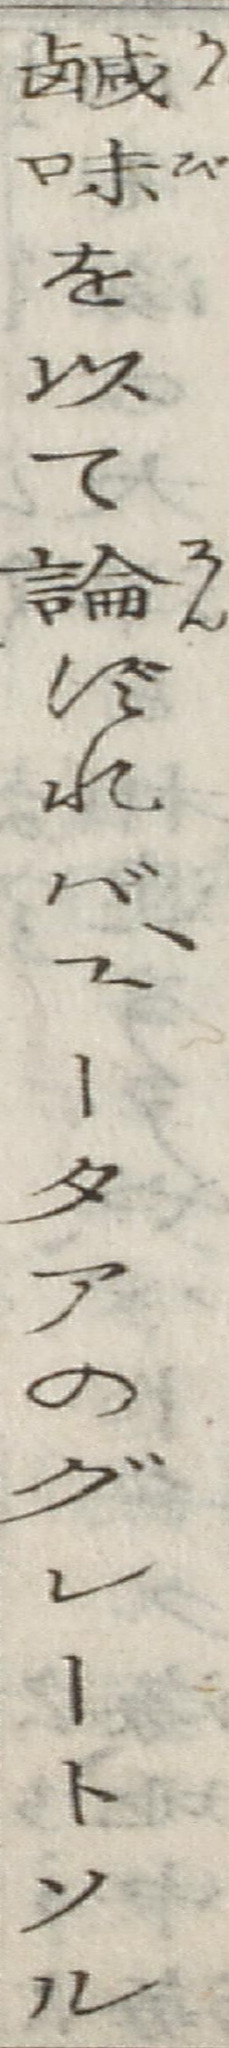鹹味を以て論ずれば、ユータアのグレートソル
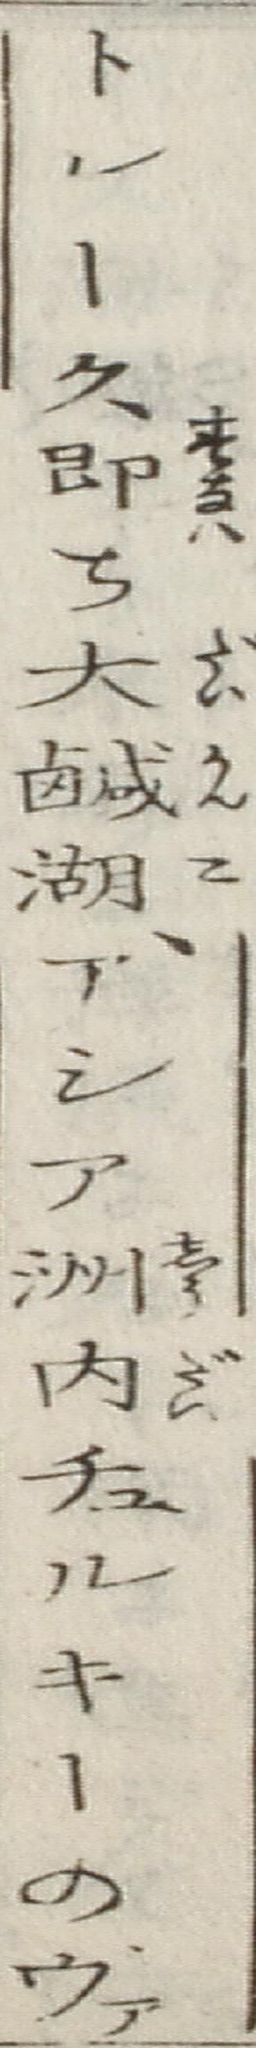トレーク、即ち大鹹湖、アシア洲内チュルキーのヴァ
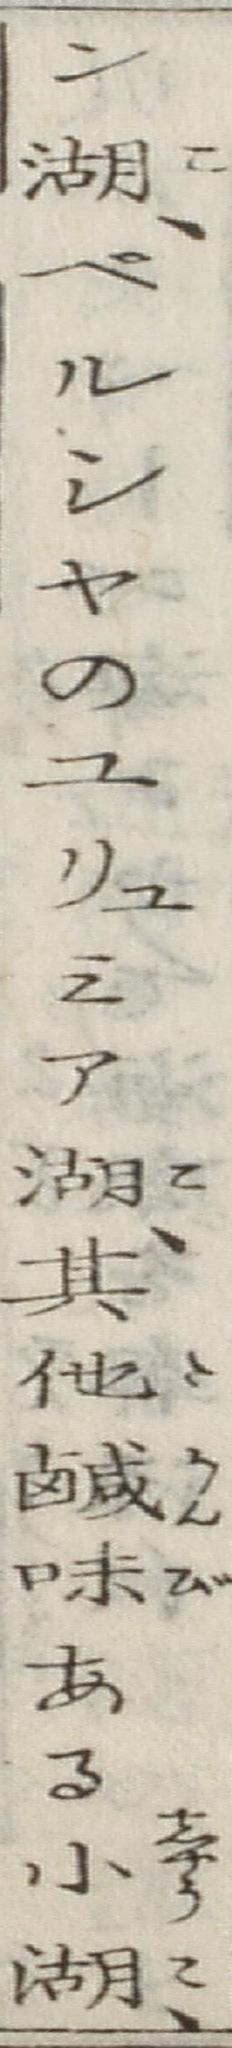ン湖、ベルシヤのユリュミア湖、其他鹹味ある小湖、
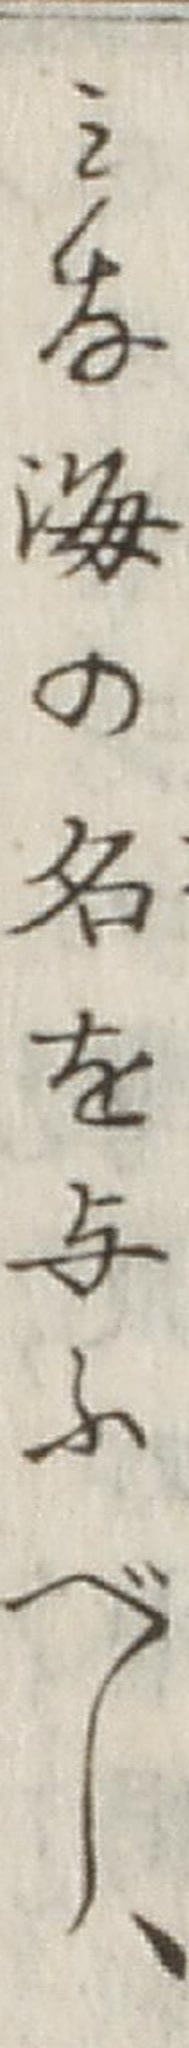みな海の名を与ふべし、
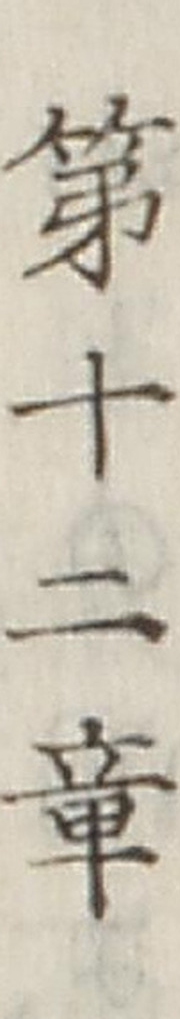第十二章
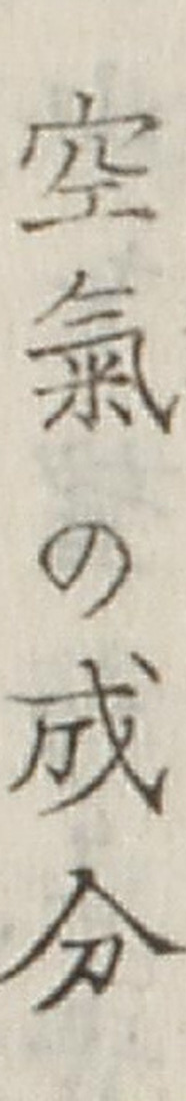空気の成分
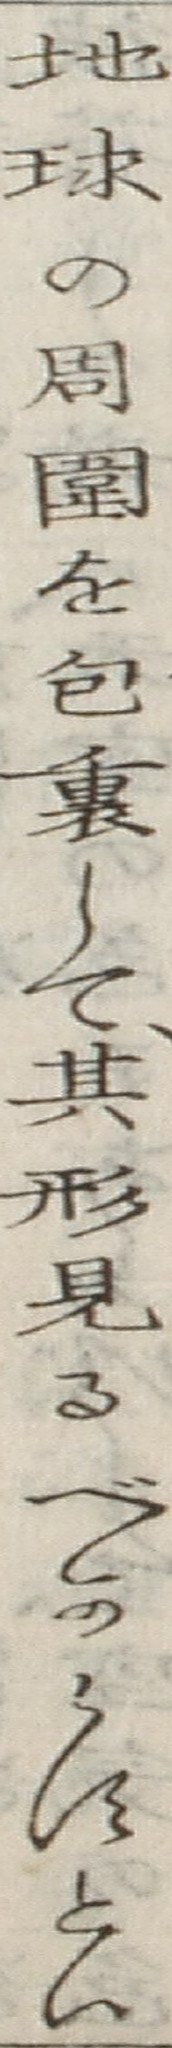地球の周囲を包裏して、其形見るべからすとい
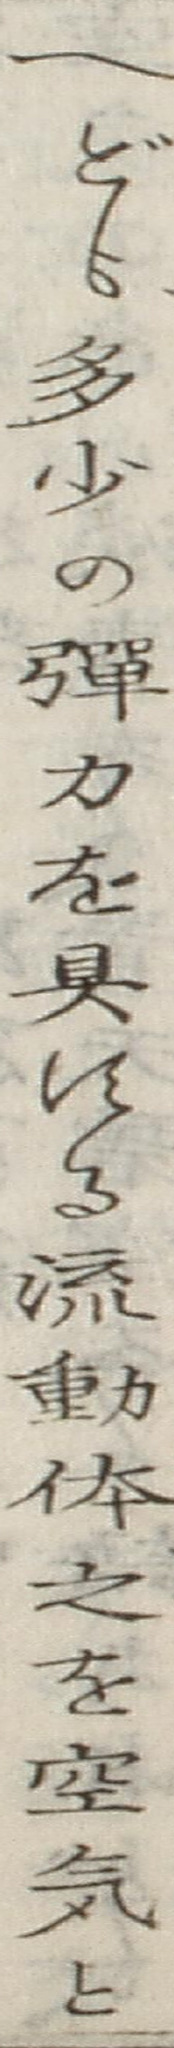へども、多少の弾力を具する流動体、之を空気と
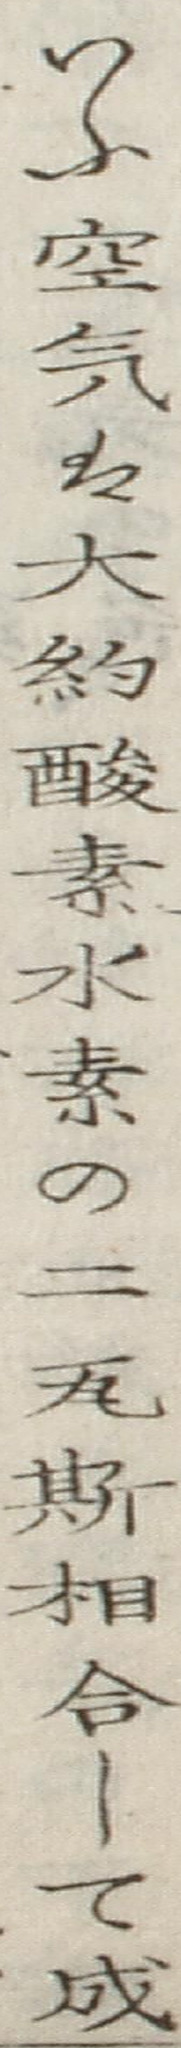いふ、空気は大約酸素、水素の二瓦斯相合して成
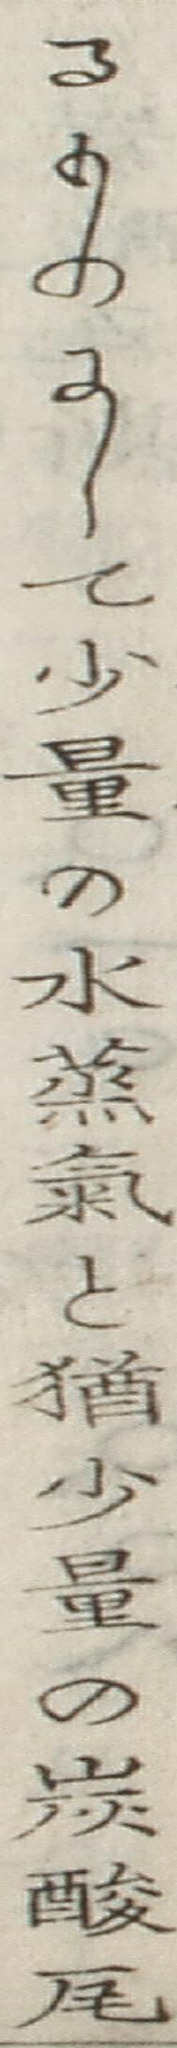るものにして、少量の水蒸気と、猶少量の炭酸瓦
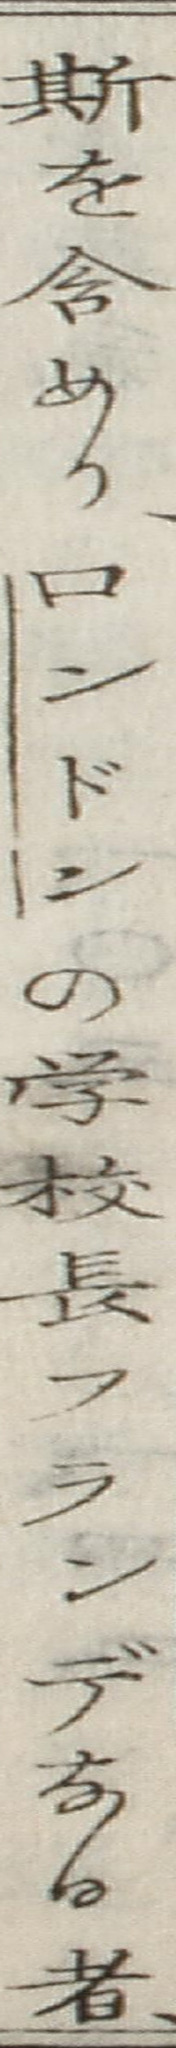斯を含めり、ロンドンの学校長フランデなる者、
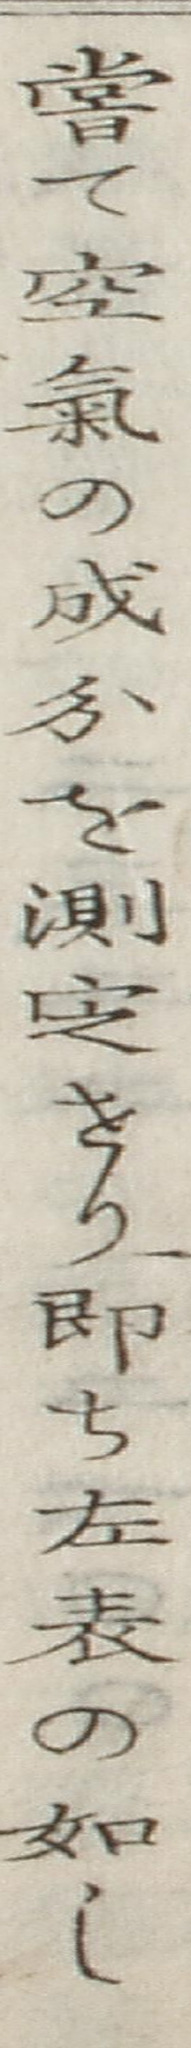嘗て空気の成分を測定せり、即ち左表の如し

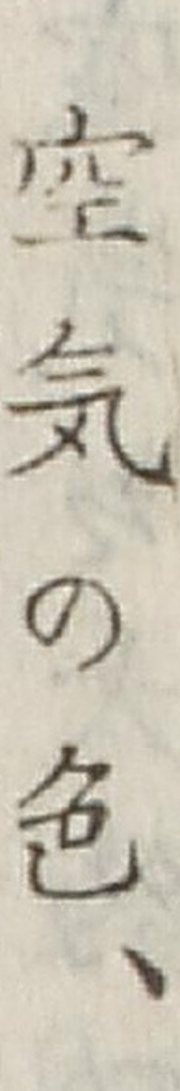空気の色、
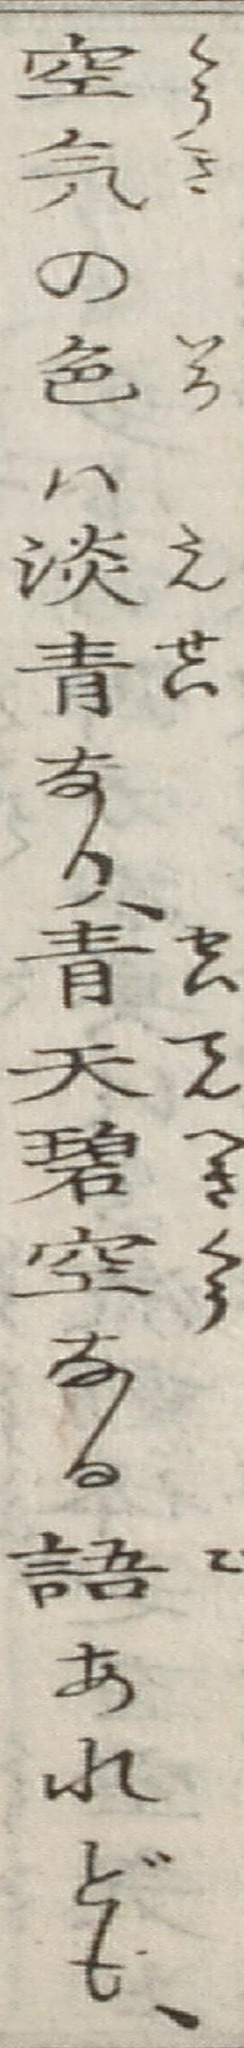空気の色は淡青なり、青天碧空なる語あれども、
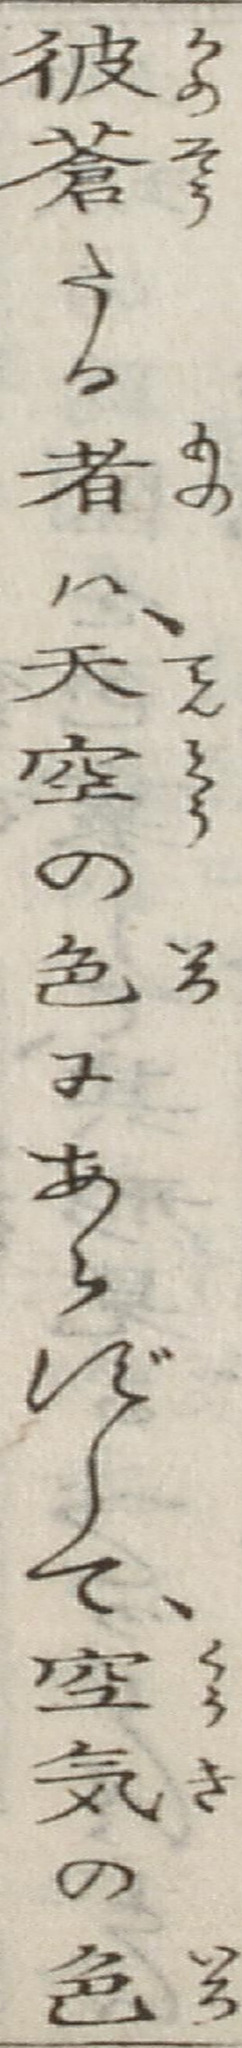彼蒼たる者は、天空の色にあらずして、空気の色
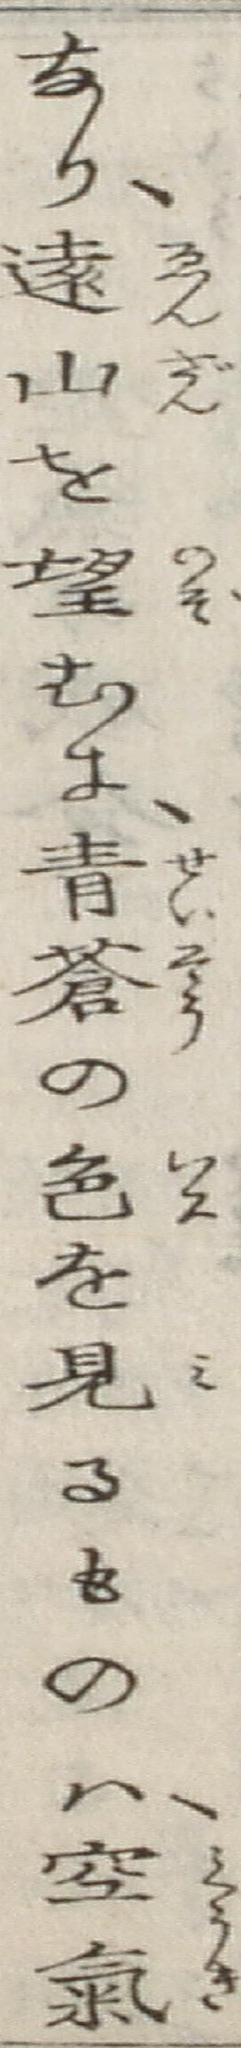なり、遠山を望むに、青蒼の色を見るものは、空気
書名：訓蒙　天然地理學　中
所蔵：東京大学地震研究所図書室 Earthquake Research Institute Library, The University of Tokyo, JAPAN
